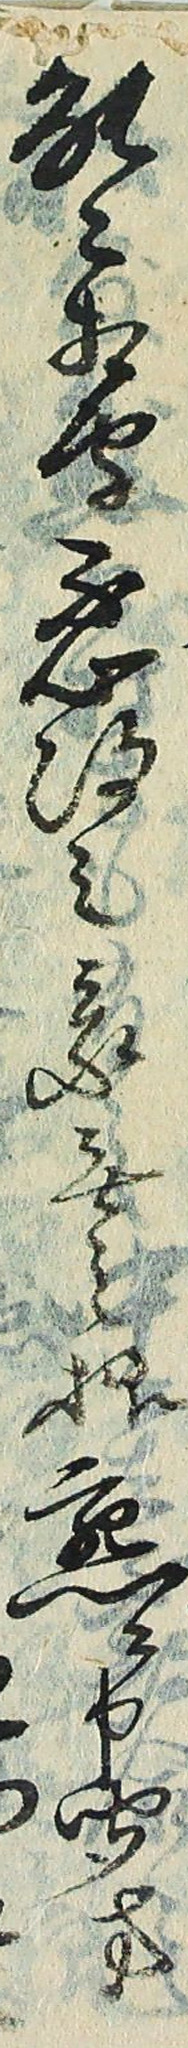能々相聞不心得之義無之様懇に申聞方
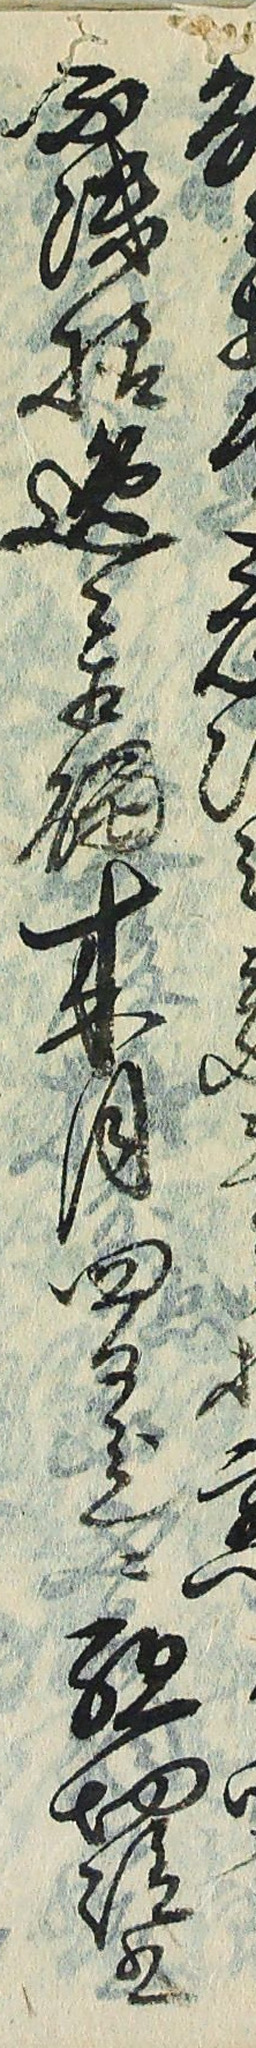不洩様逸々相触来月四日迄に組切請書
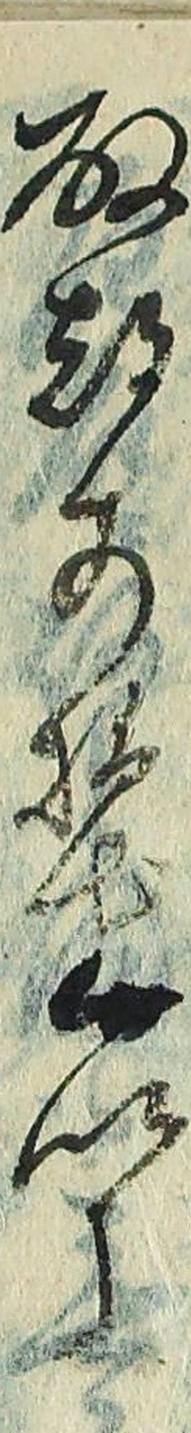取都可指出候以上
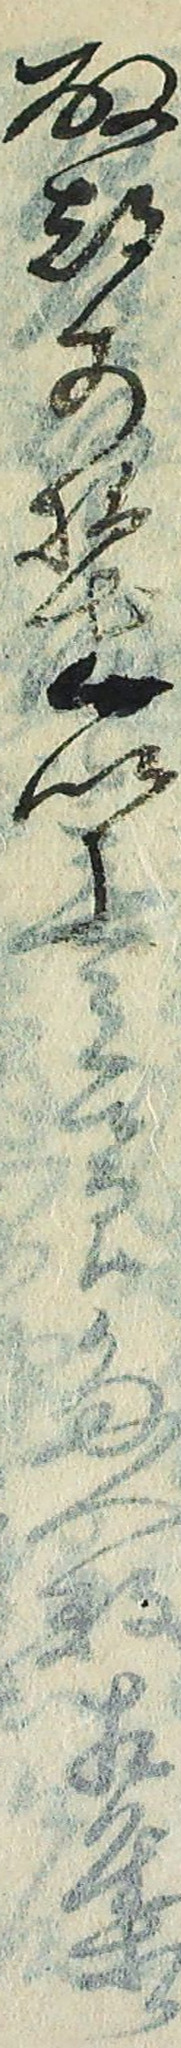取都可指出候以上
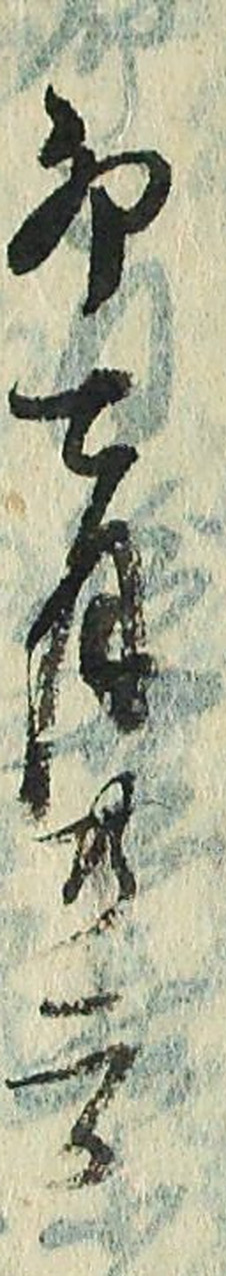卯七月廿二日
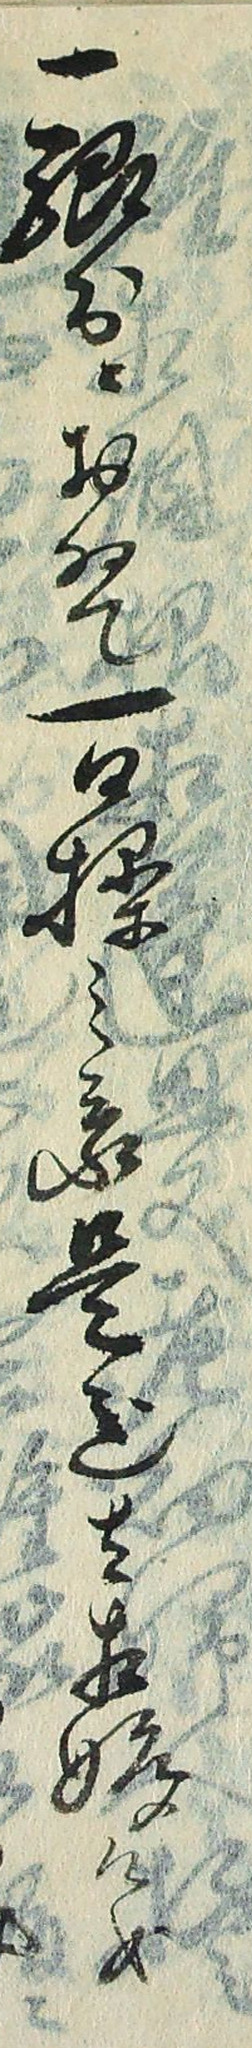一郷分におゐて一日操之義是迄は相始め候義
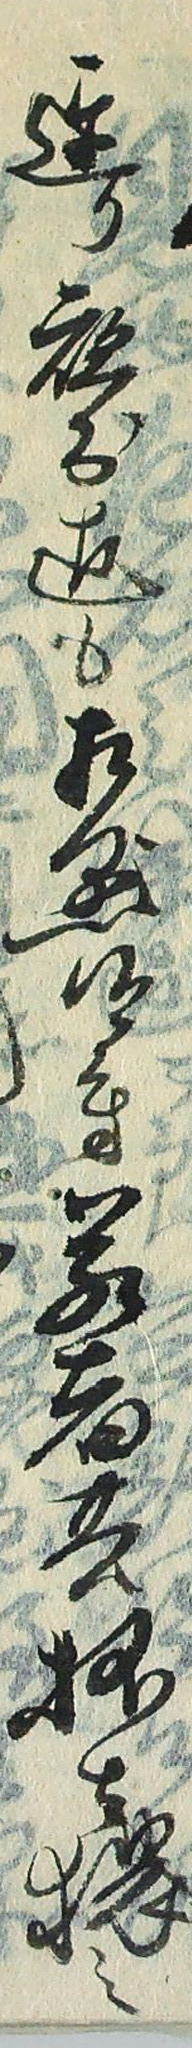遅り夜分迄も相懸候に付若者共抔は猥之
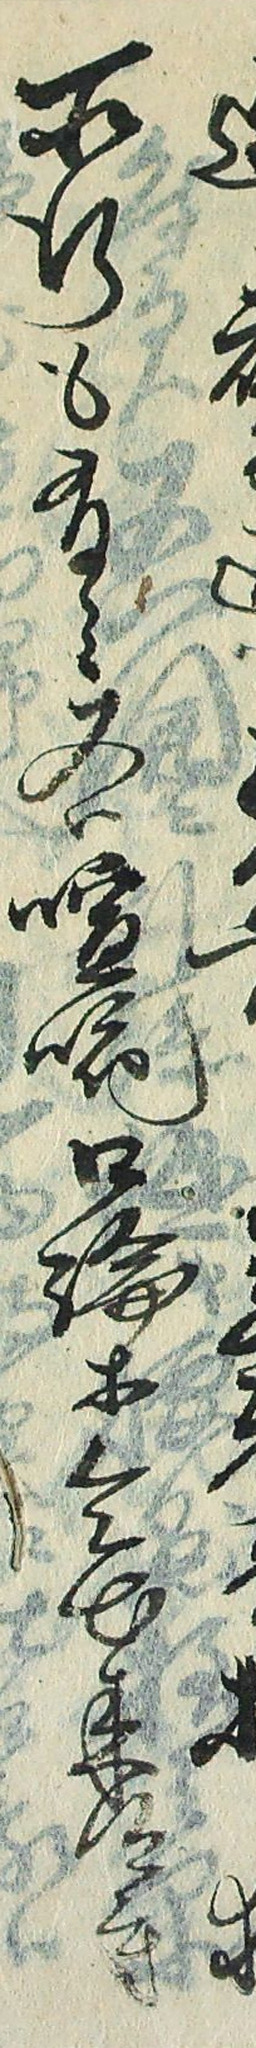所行も有之又は喧嘩口論等令出来候に付
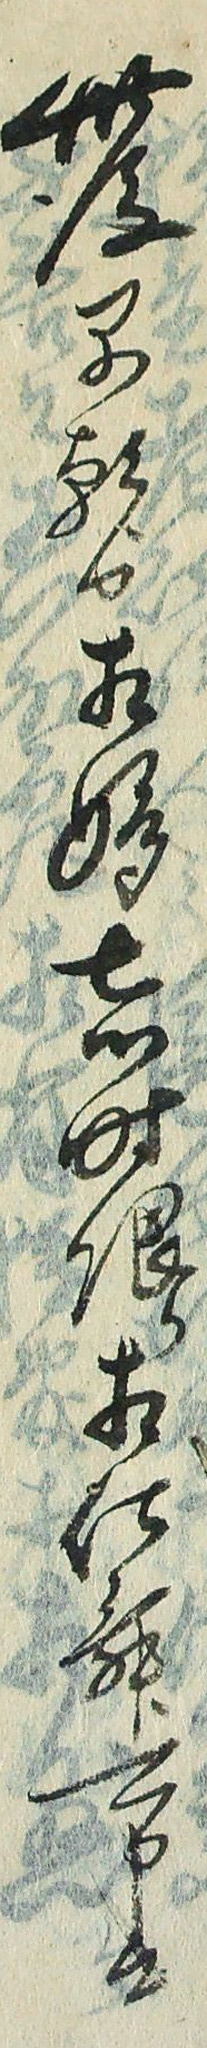此後早朝ゟ相始め七つ時限り相仕舞可申候

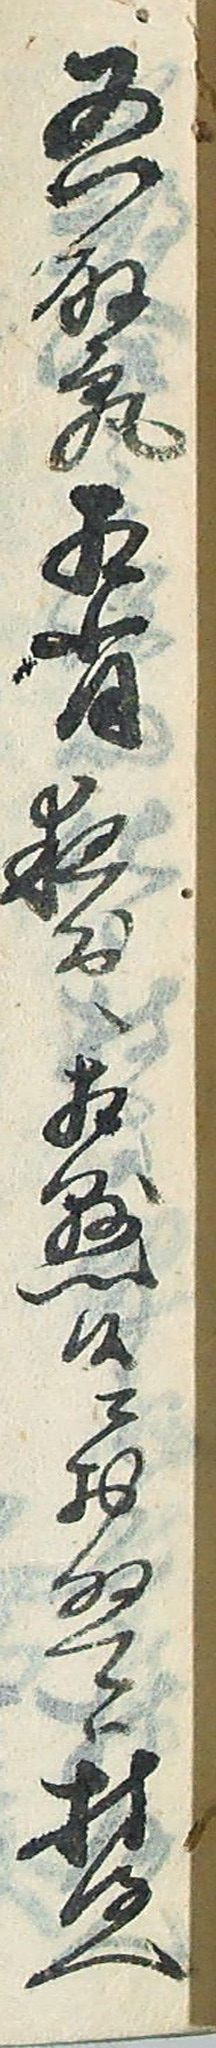右取究相背夜分へ相懸候におゐては村役人
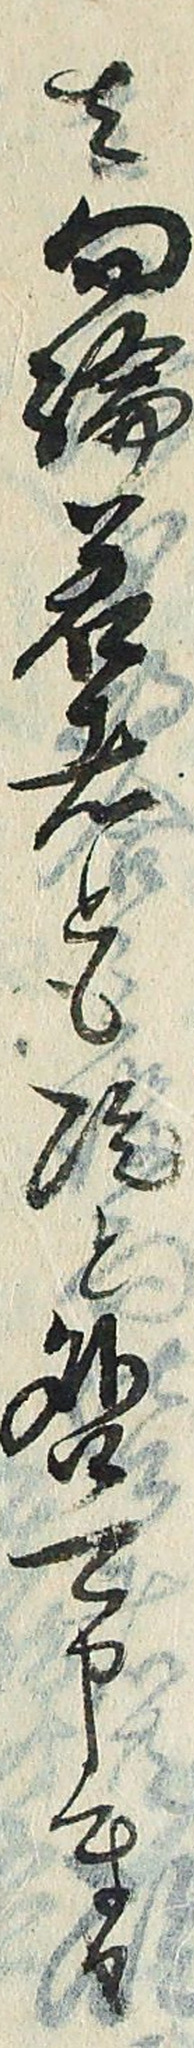は勿論若者とも屹と咎可申付候
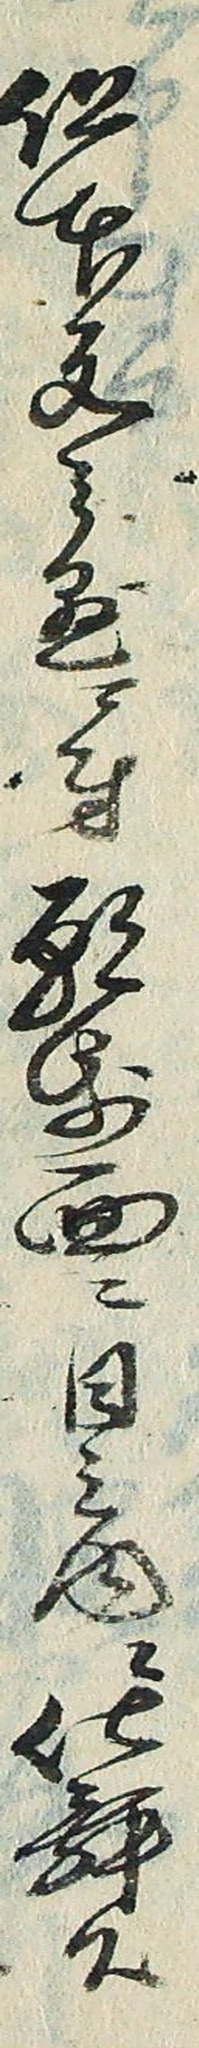但本文之懸に付願紙面に日之内に仕舞候
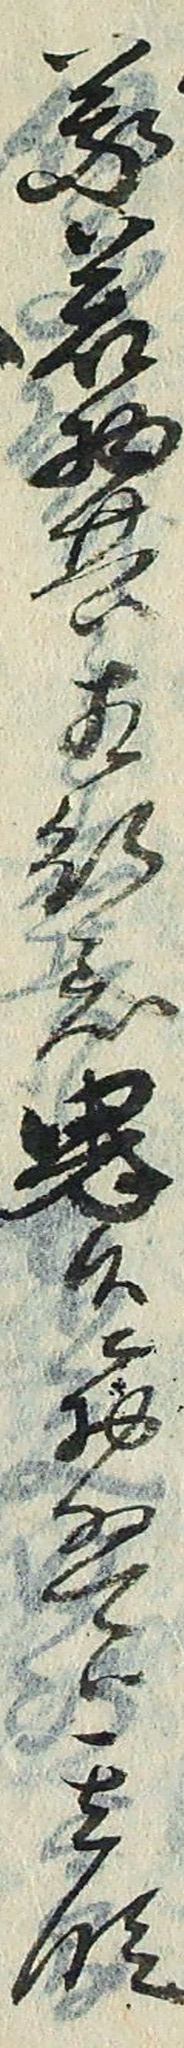義若物共相行着畏候におゐては其段
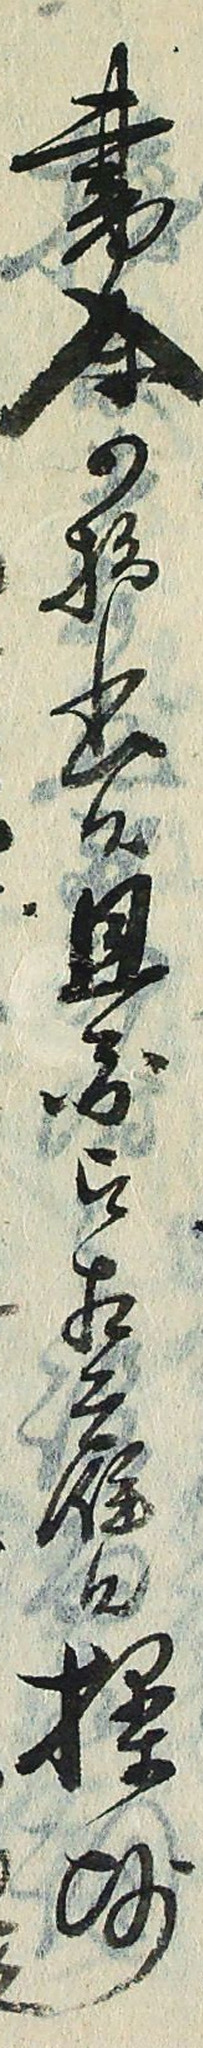書入可指出候且亦被相雇操師
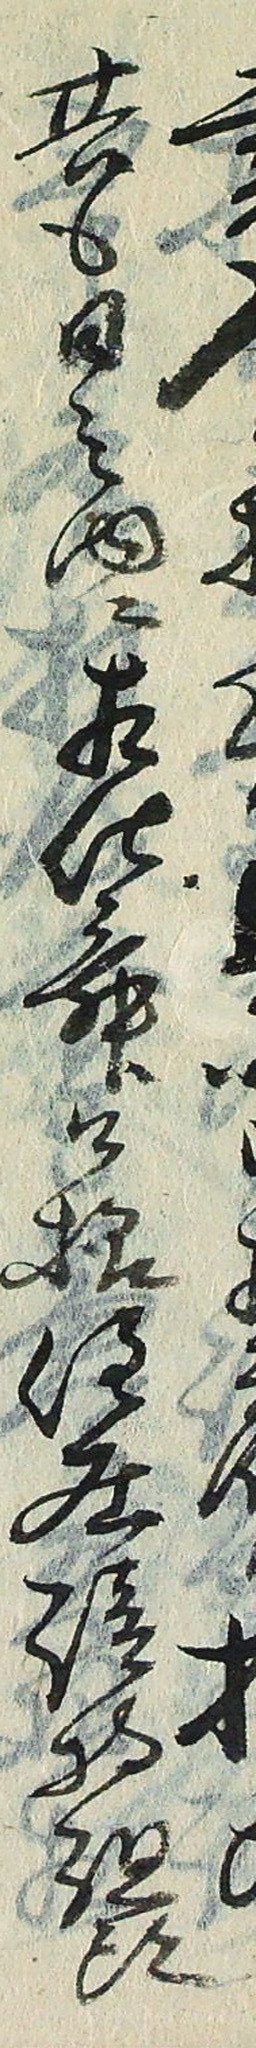共も日之内に相仕舞候様住居請持組頭
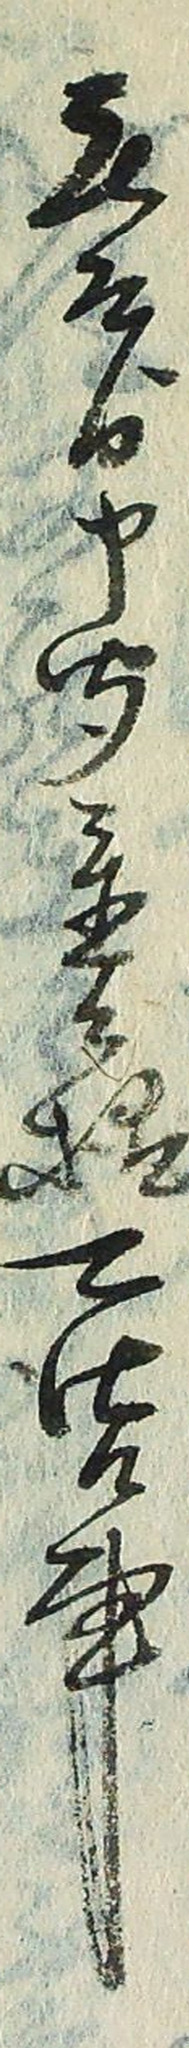庄屋ゟ申聞置候様可仕候事
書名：諸御用御□受書控
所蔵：鳴門教育大学 Naruto University of Education
